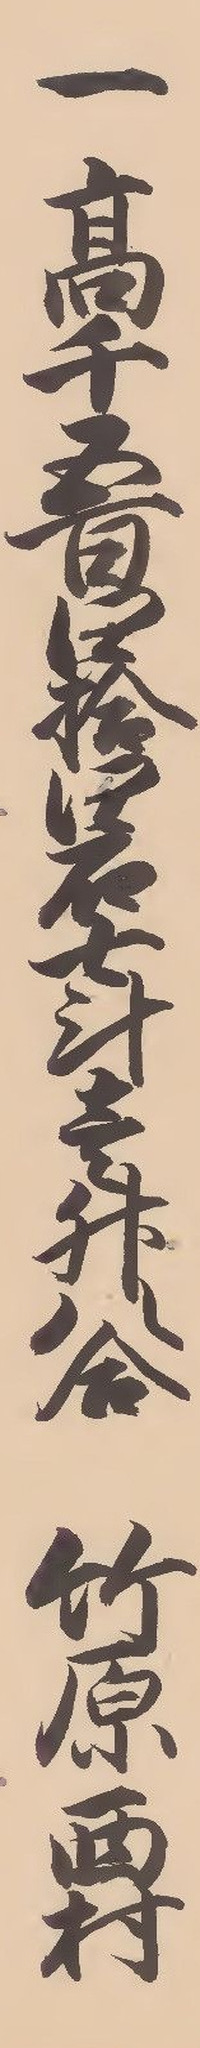一高千五百四拾四石七斗壱升八合竹原西村

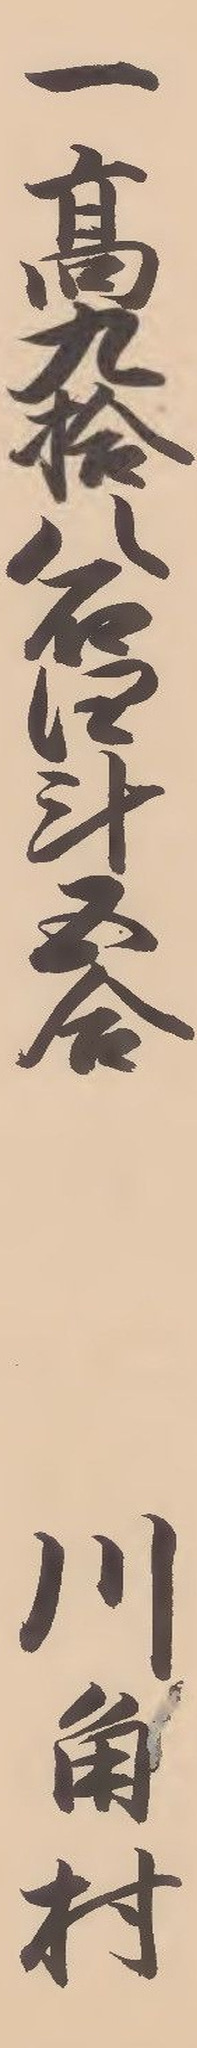一高九拾八石四斗五合川角村
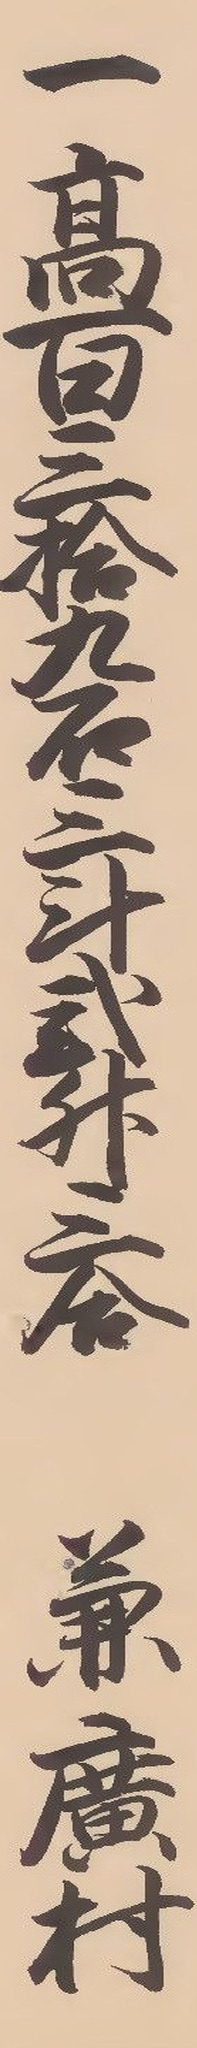一高百三拾九石三斗弐升三合兼広村
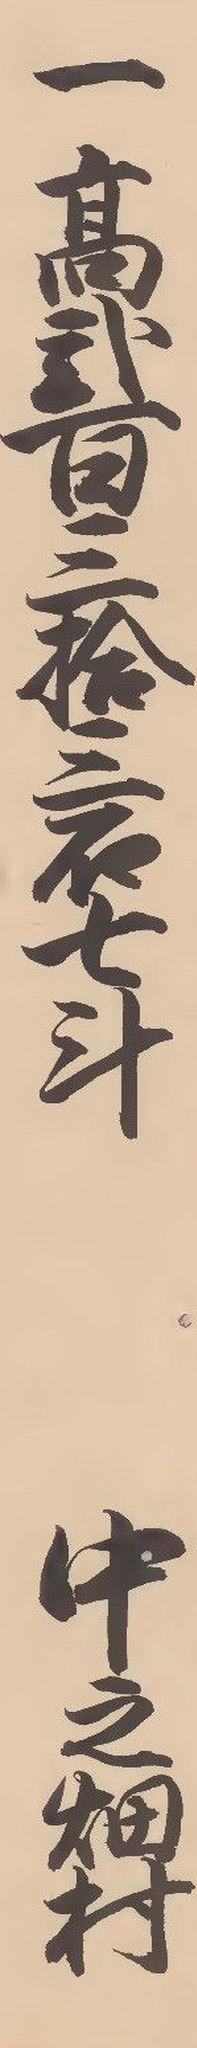一高弐百三拾三石七斗中之畑村
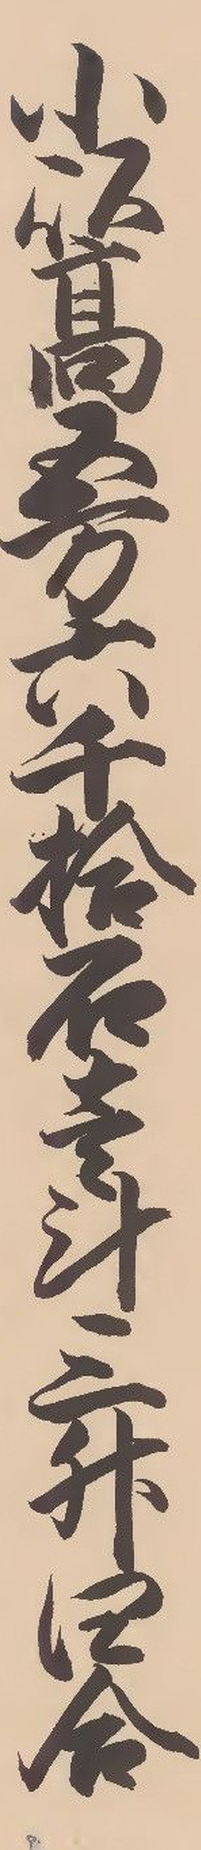小以高五万六千拾石壱斗三升四合

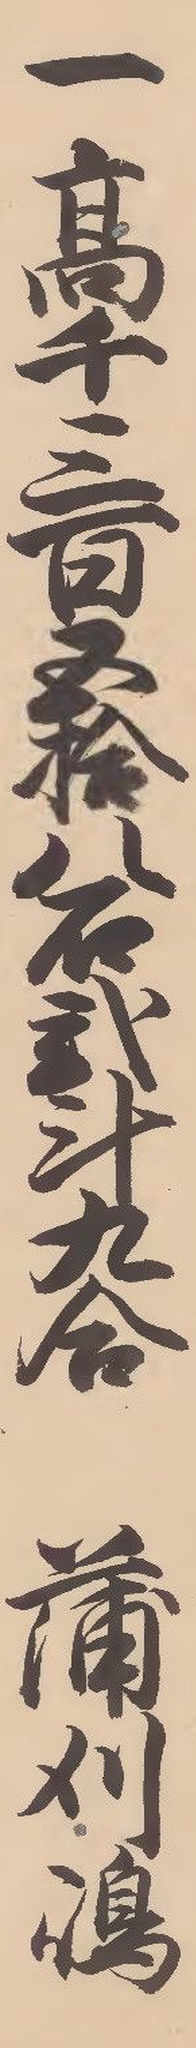一高千三百五拾八石弐斗九合蒲刈島
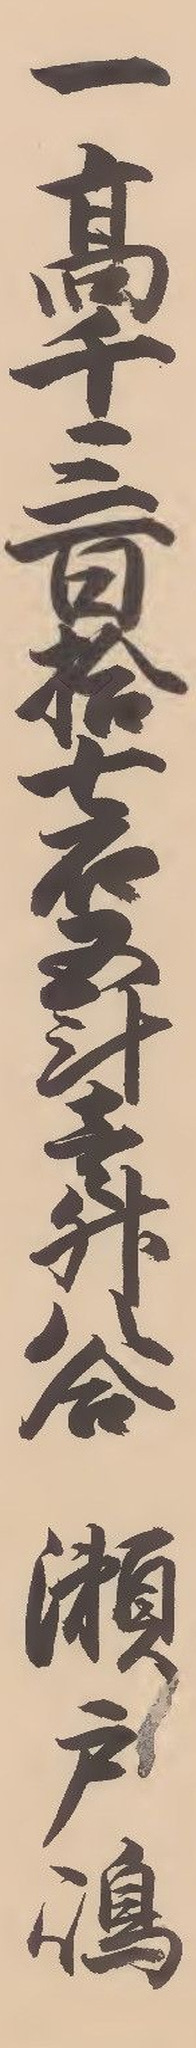一高千三百拾七石五斗壱升八合瀬戸島
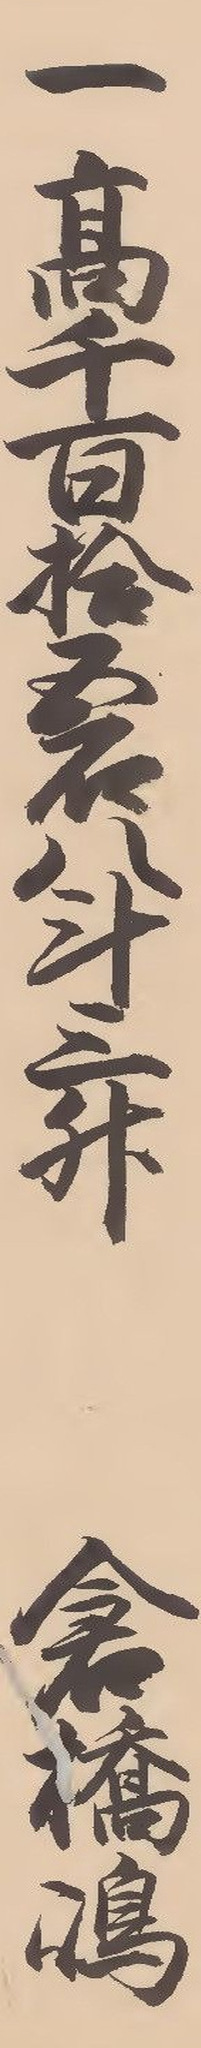一高千百拾五石八斗三升倉橋島
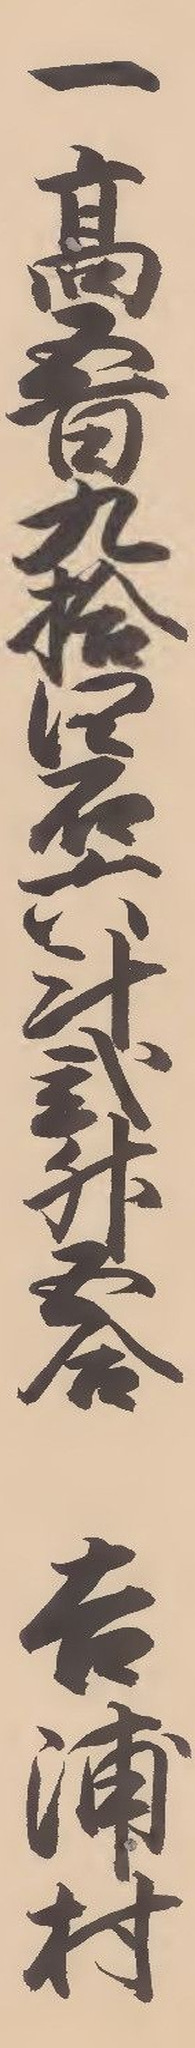一高五百九拾四石六斗弐升五合吉浦村
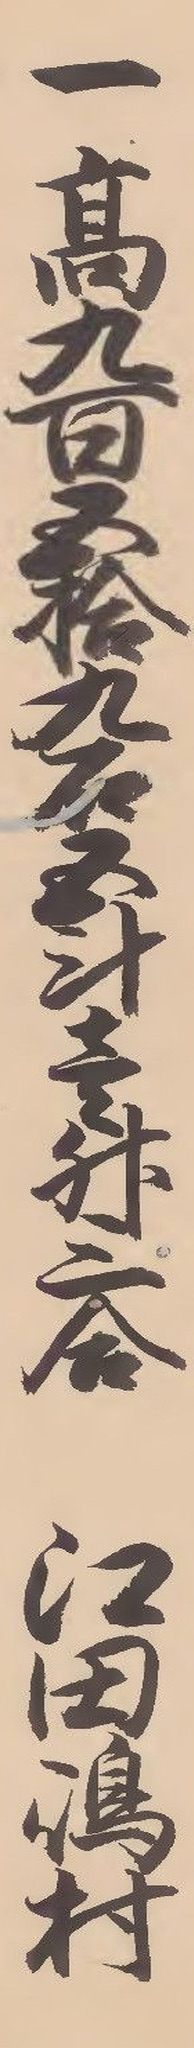一高九百五拾九石五斗壱升三合江田島村

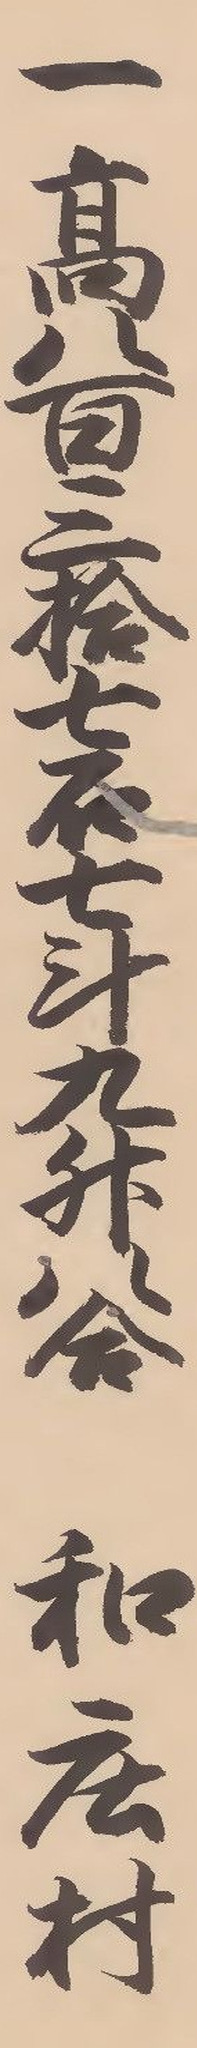一高八百三拾七石七斗九升八合和庄村
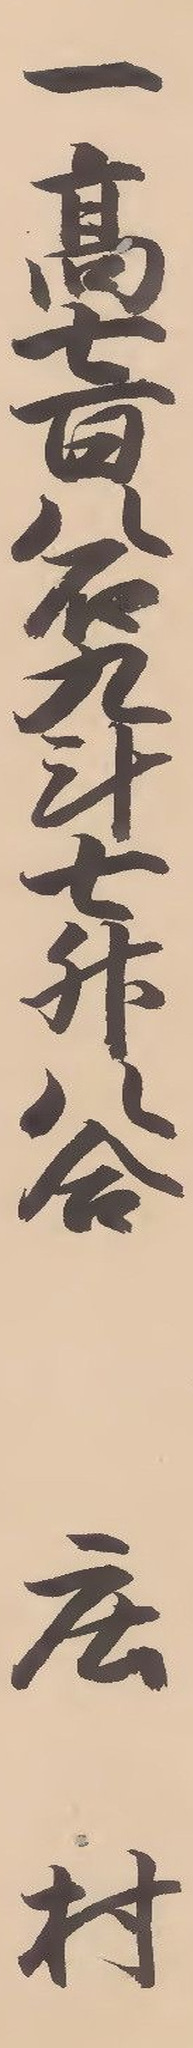一高七百八石九斗七升八合庄村
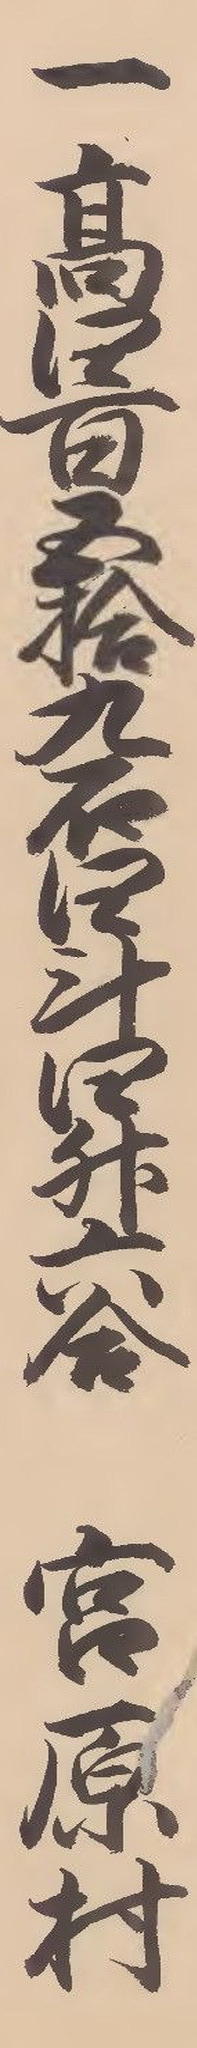一高四百五拾九石四斗四升六合宮原村
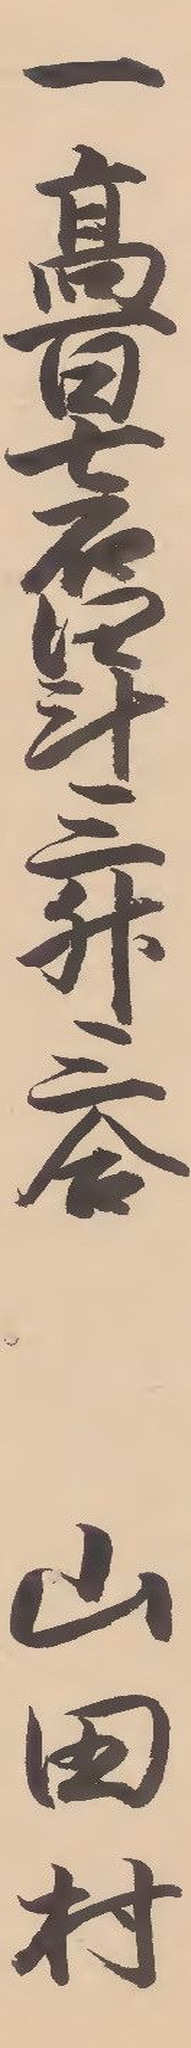一高百七石四斗三升三合山田村
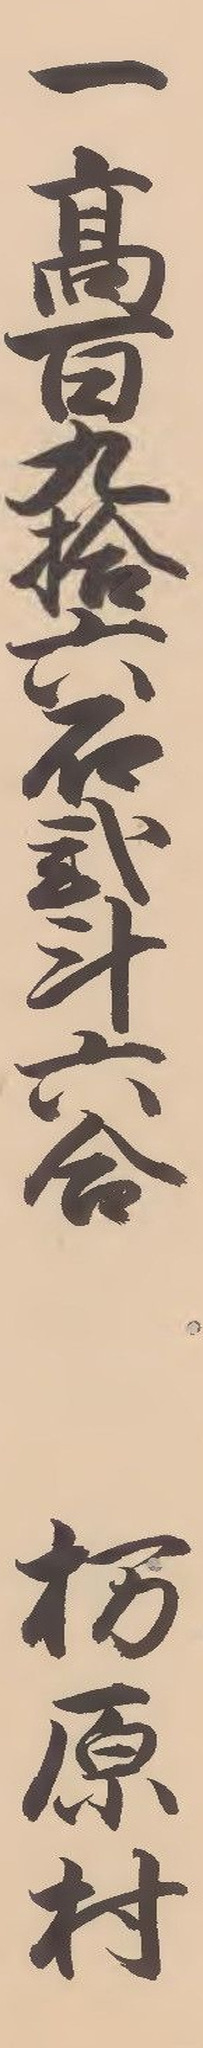一高百九拾六石弐斗六合栃原村
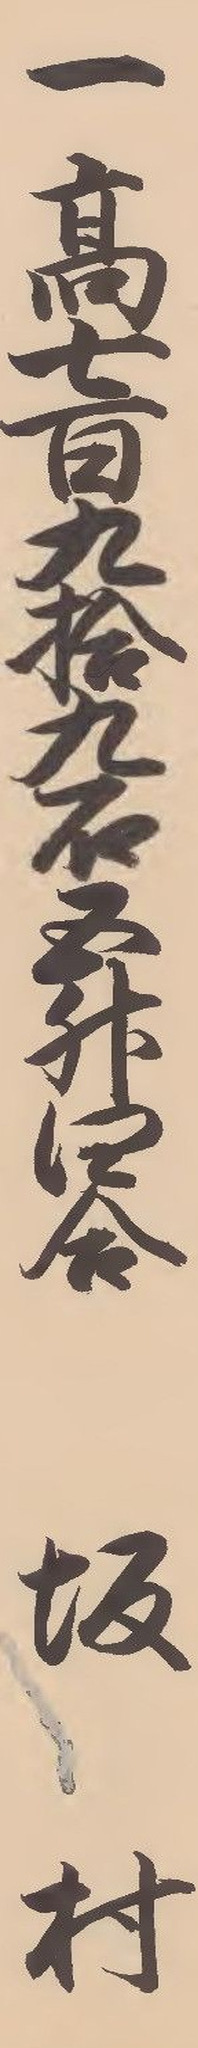一高七百九拾九石五升四合坂村
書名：安芸国郷帳
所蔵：国立公文書館 National Archives of Japan
